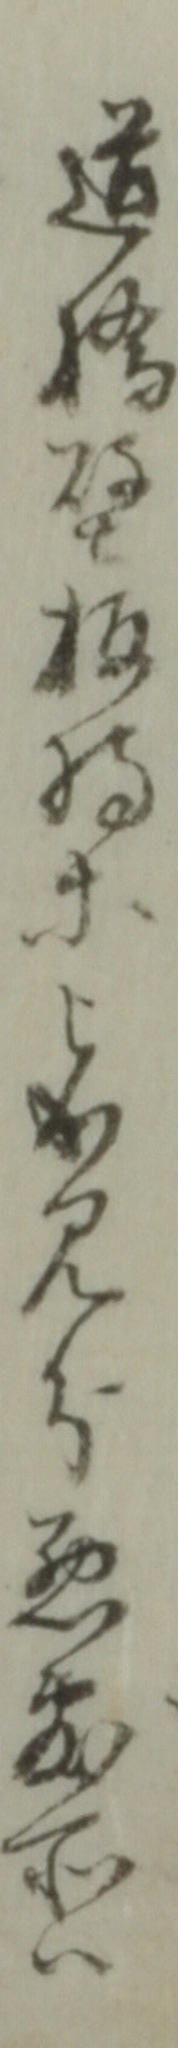道橋壁板持等被成見分悪敷所は
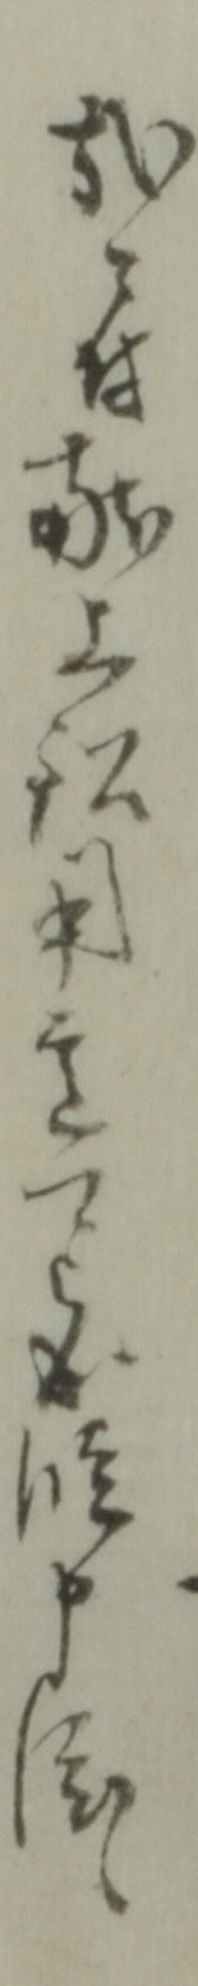哉に付献上船用意可被成段申渡候

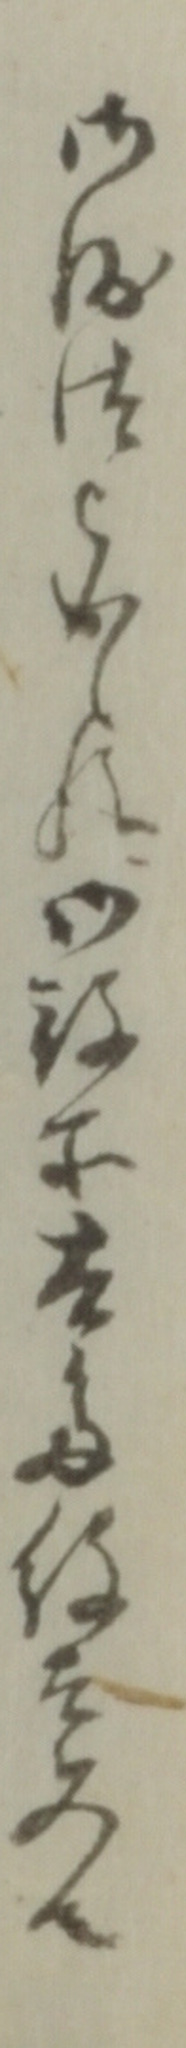御沙汰被成候様御役所者多紋太文へ
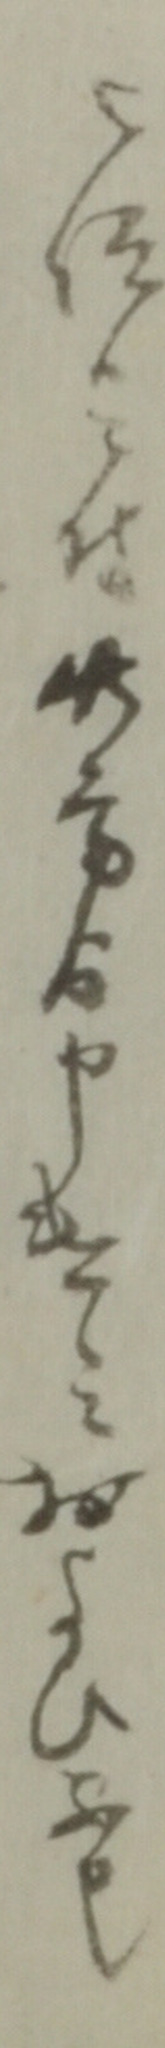被仰候ニ付此方ゟ申遣候ニおよび不申候
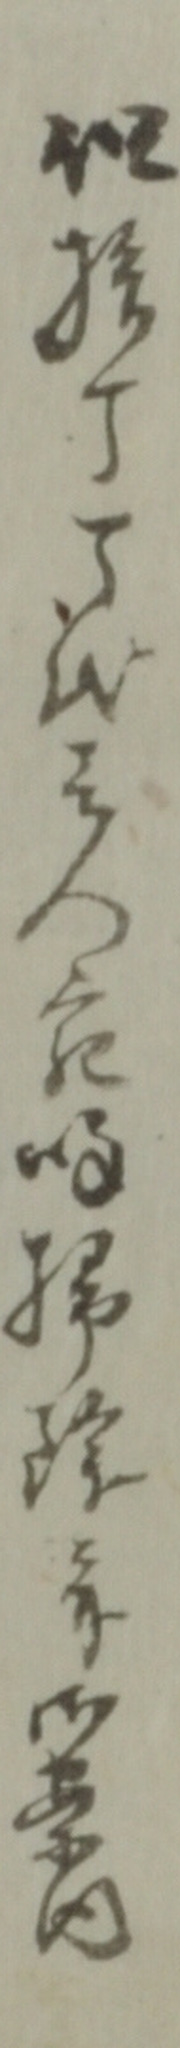但拾丁丁代壱人宛呼掃除并御案内
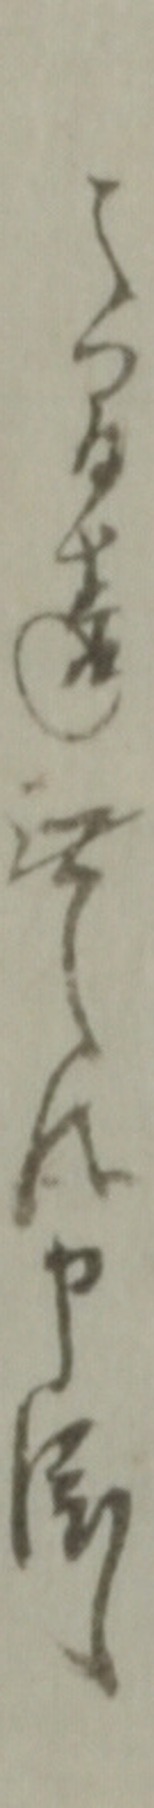之間違無之様申渡候
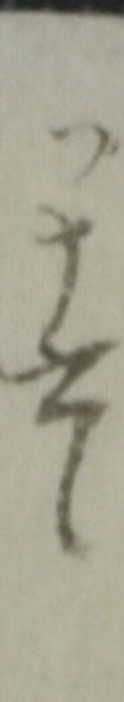同十六日
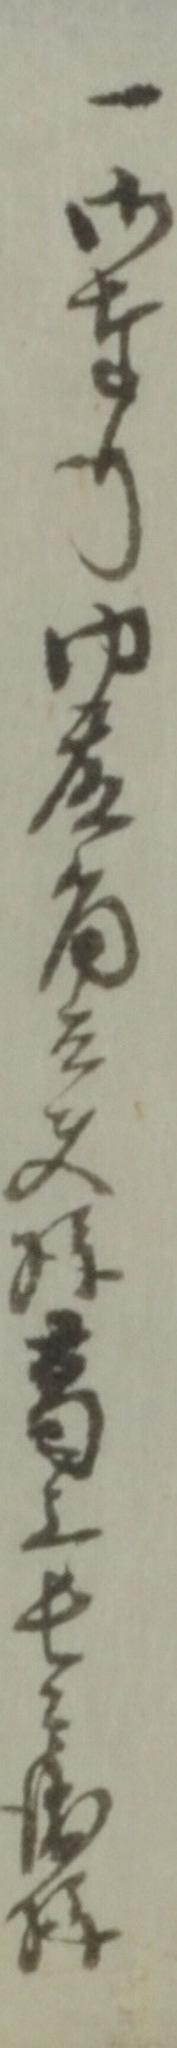一御奉行内藤角太夫様葛上長兵衛様
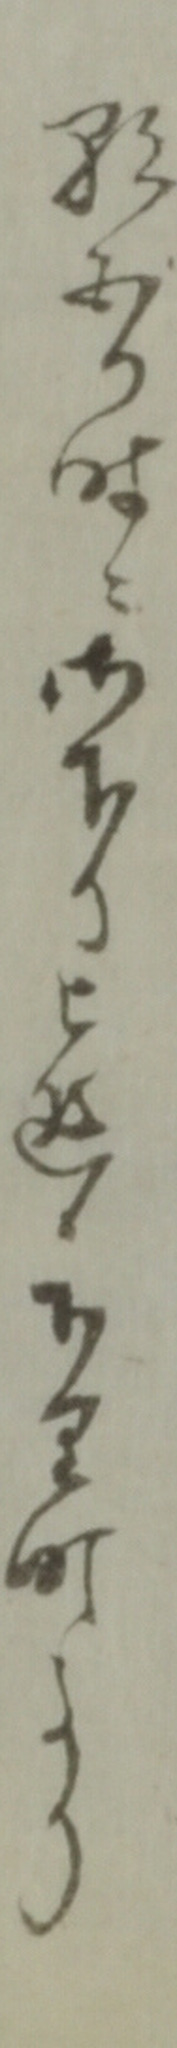朝五ツ時ニ御下リ被遊候下里町より
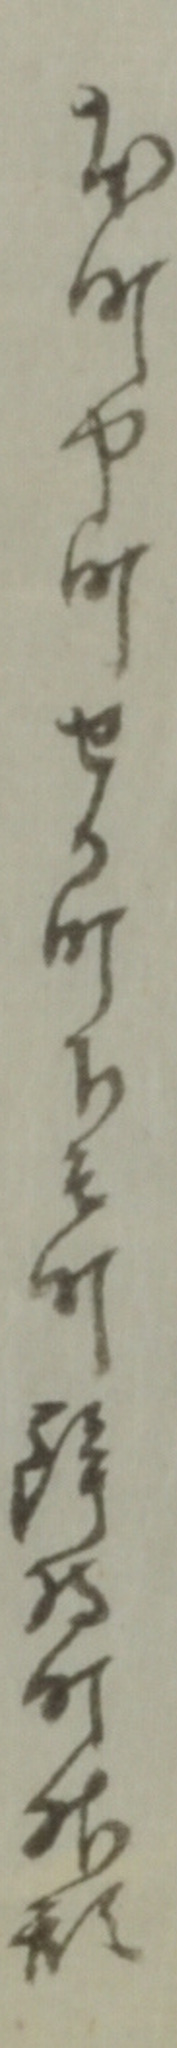本町中町せり町下モ町鉾持町升形
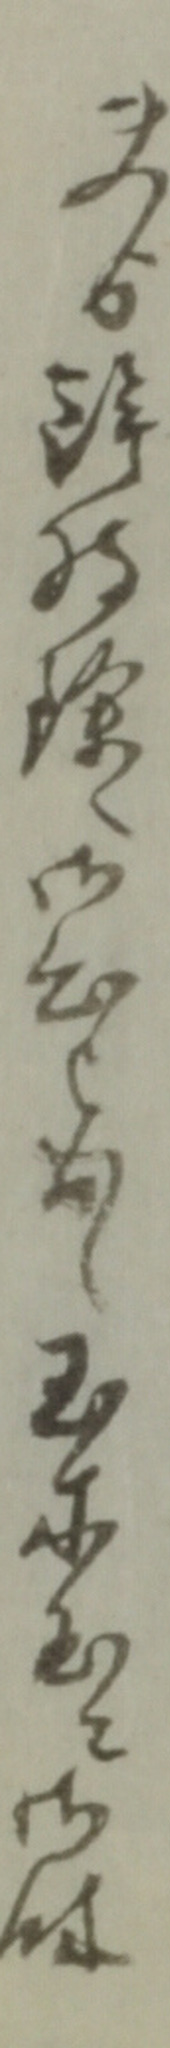夫ゟ鉾持除へ御出被成候玉木屋ニ御休
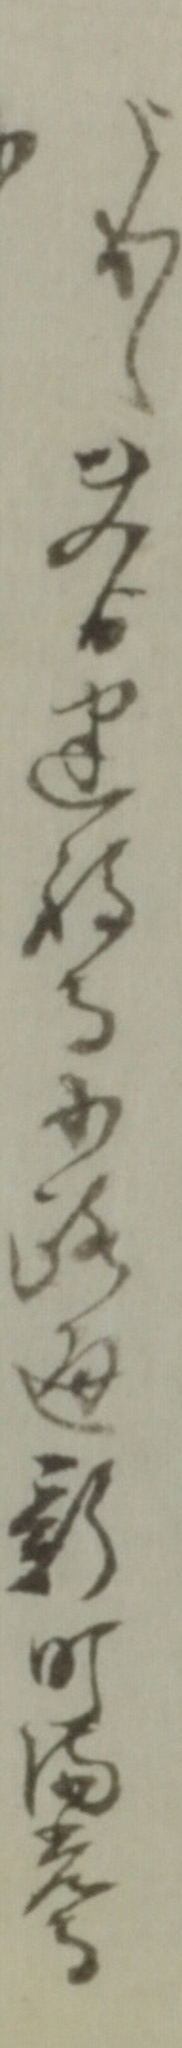被成候夫ゟ建福寺小路通新町満光寺
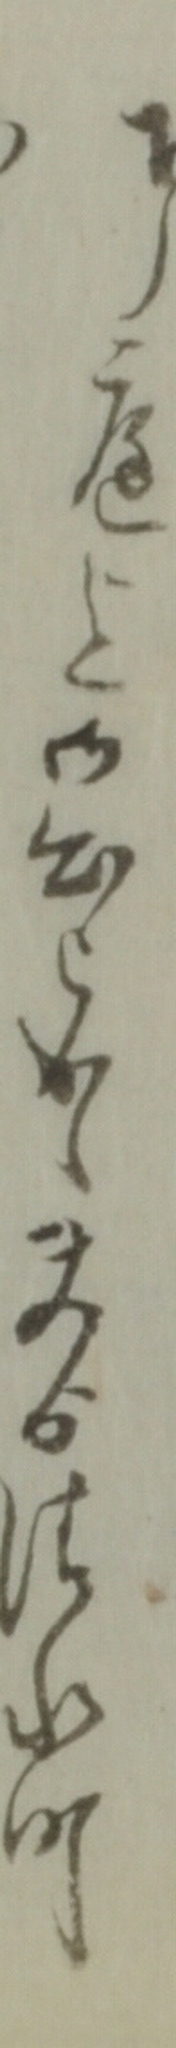下ノ庭迄御出被成候夫ゟ清水町
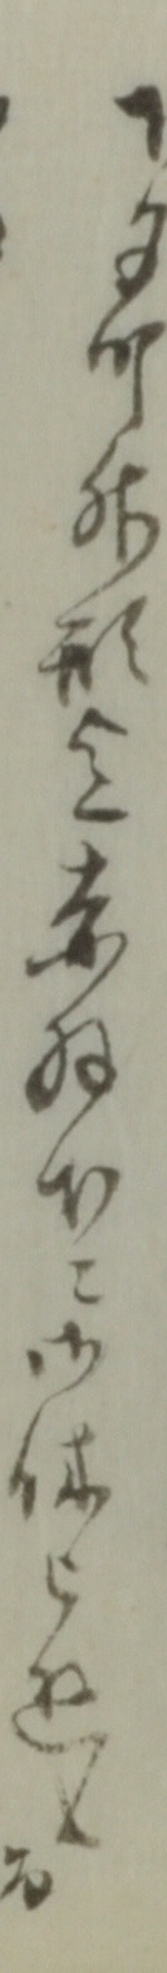下タ町升形迄赤羽下ニ御休被遊候而
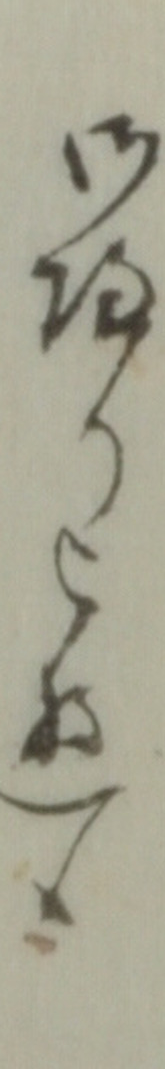御帰リ被遊候
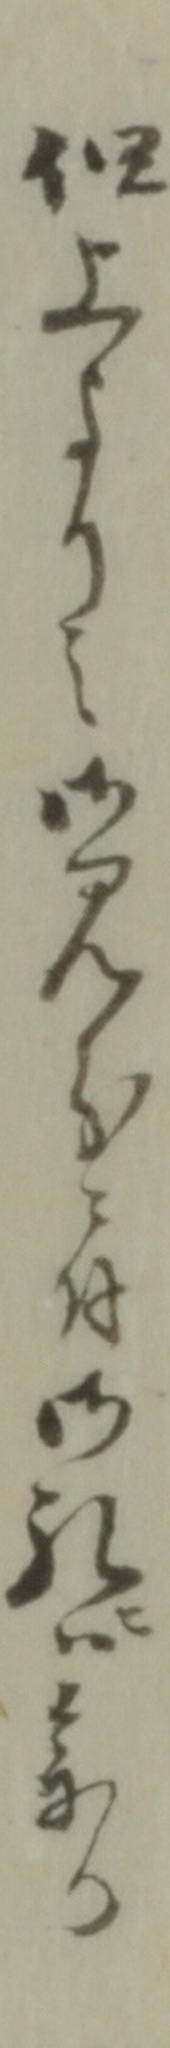但上より之御見分ニ付御礼ニハ参リ
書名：御初入諸事控
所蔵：伊那市立高遠町図書館・合同会社AMANE
